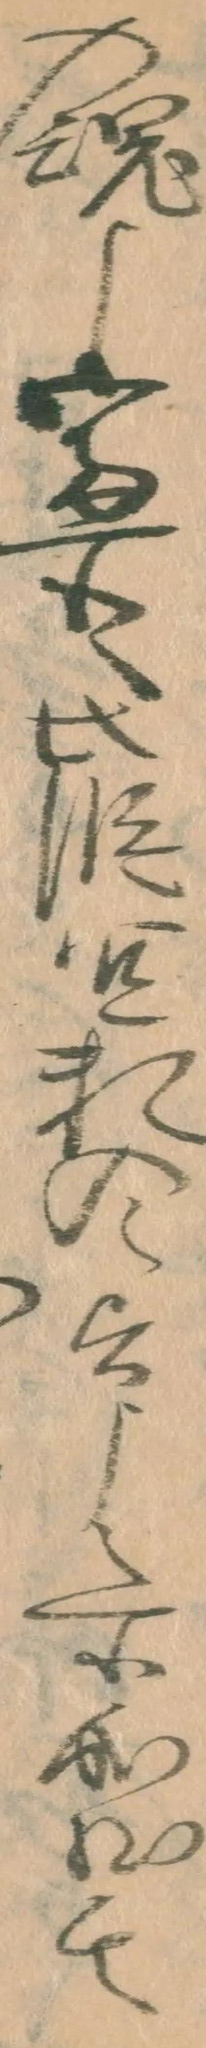入魂申御両所へ此段宜頼入候旨申之所成程其
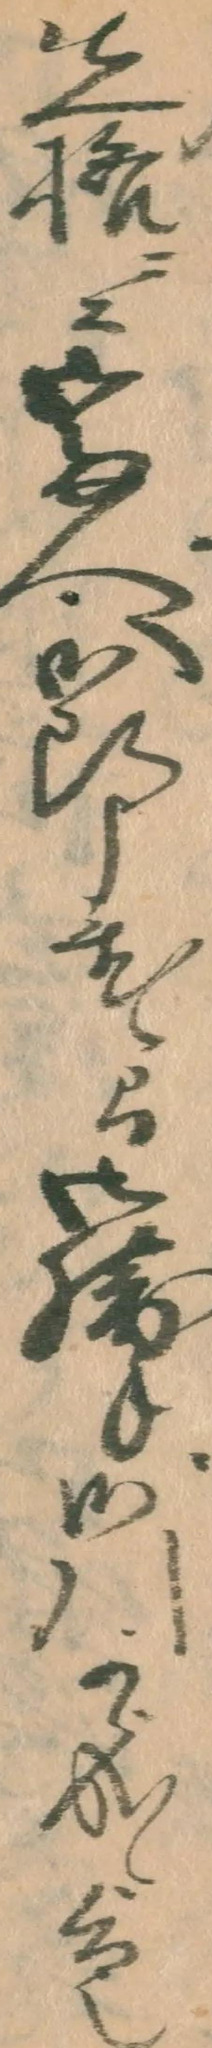先格ニ而御両人へ御断申置候間御勝手ニ御引可被成候旨也
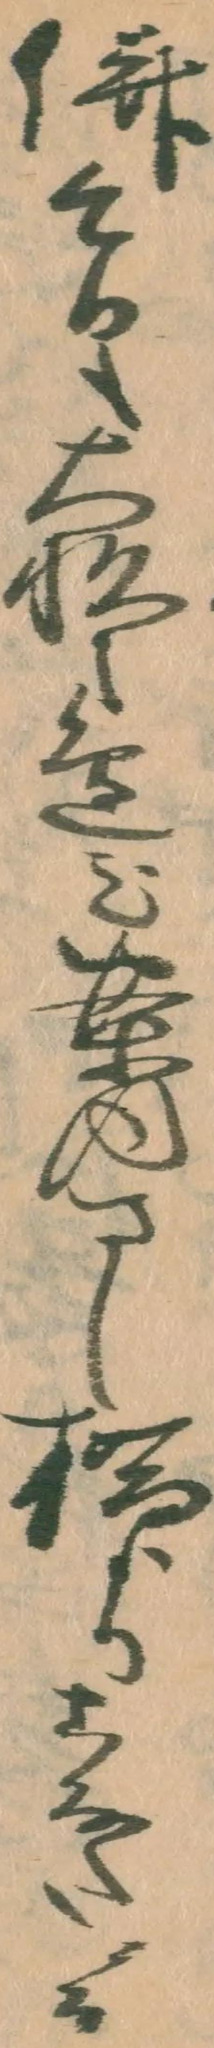併今日も大杉之辺迄案内さし橋よりこなたニ而
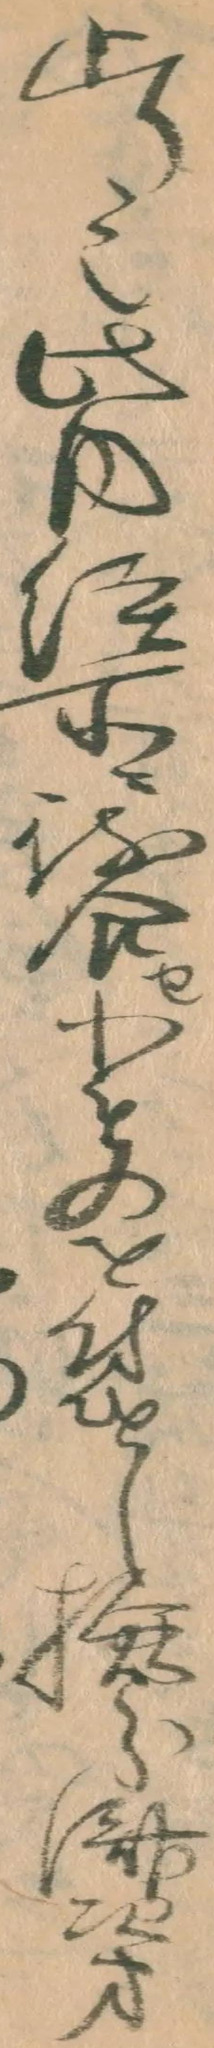止り候也此内所ニ待合セ小ものを付遣し検分済次第
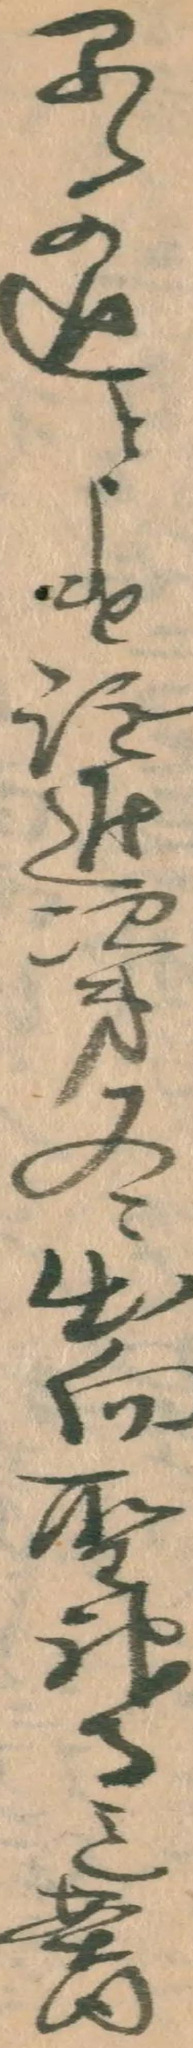早々可返と申遣注進次第又々出向聖神寺迄案内
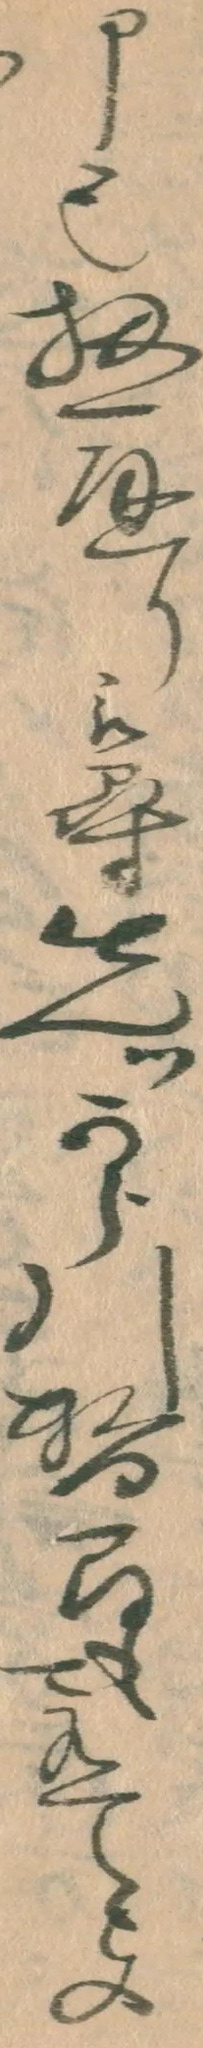申候也扨一通り被尋先ツ可被引替間も可有之との
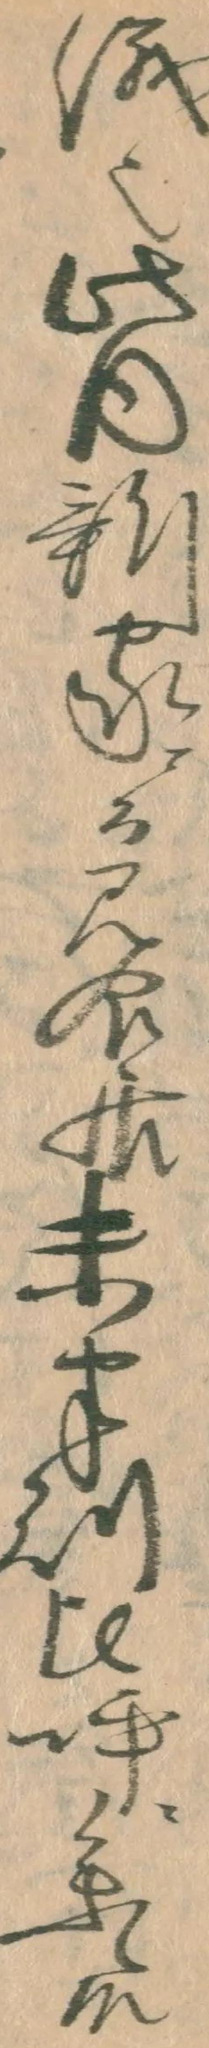儀也此内新家ニ而見合居未半刻比呼ニ参候故
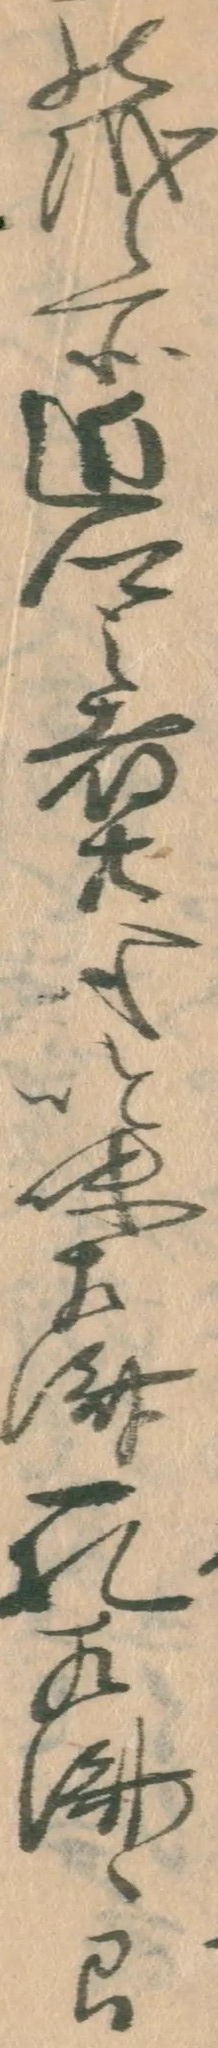罷越候所近郷之者共へも吟味相済一札相済候間
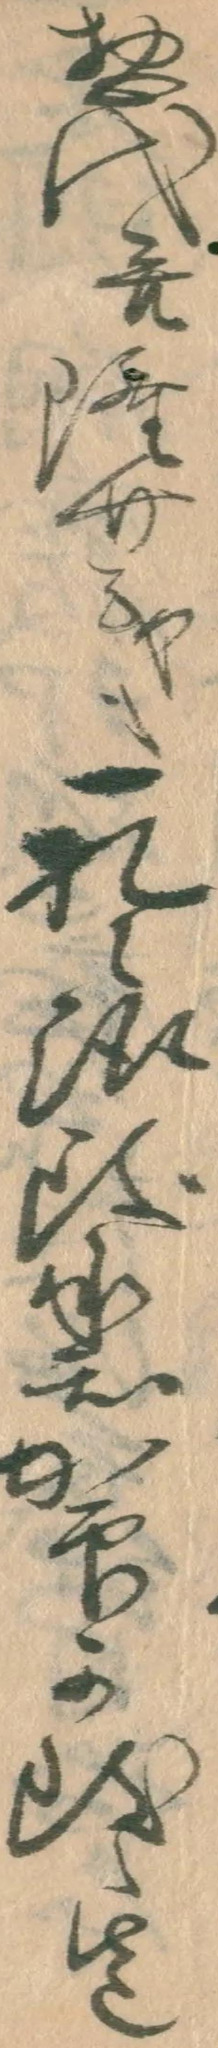惣代并隆介義も一札之趣致承知加印可致候由也
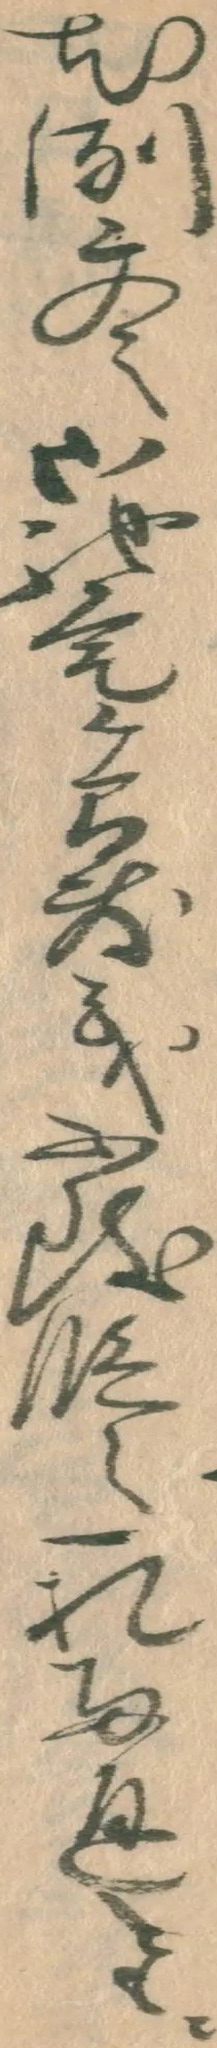尤例文之御馳走ヶ間敷義不致段之一札両通ともニ
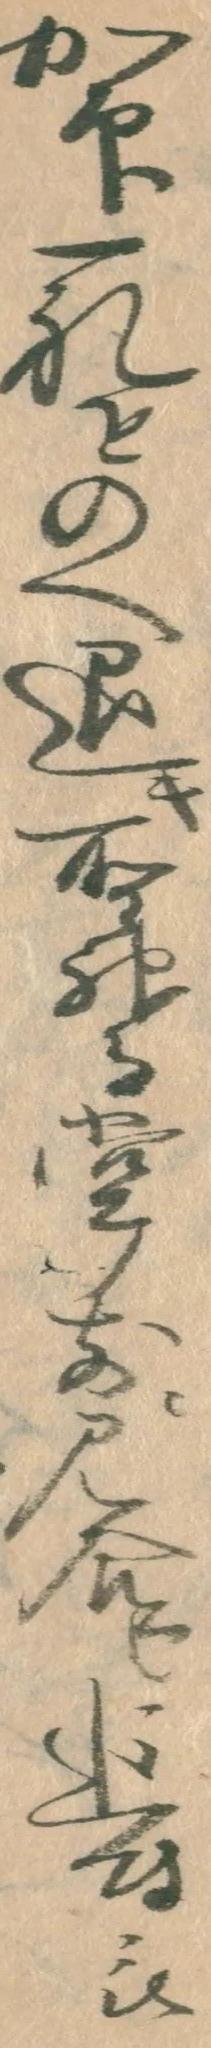加印一礼をのへ退キ聖神寺堂ノ前ニ見合せ追付被
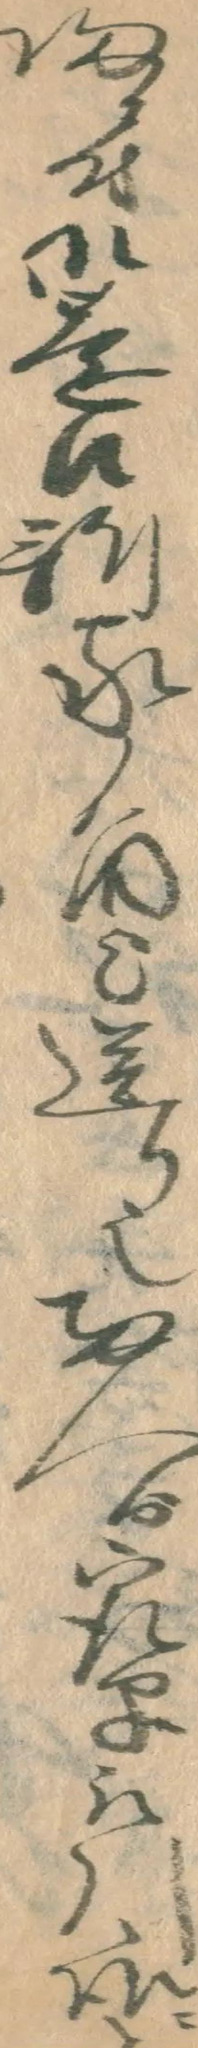帰ニ付御薗口新家ノ角迄送り也両人ゟ最早被引候様ニと
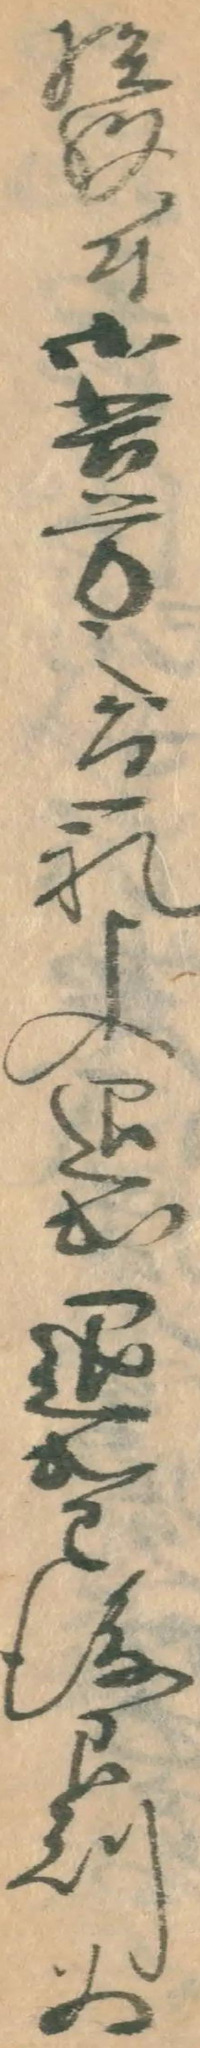挨拶ニ付御苦労之旨一礼申入退出退出已後即刻為

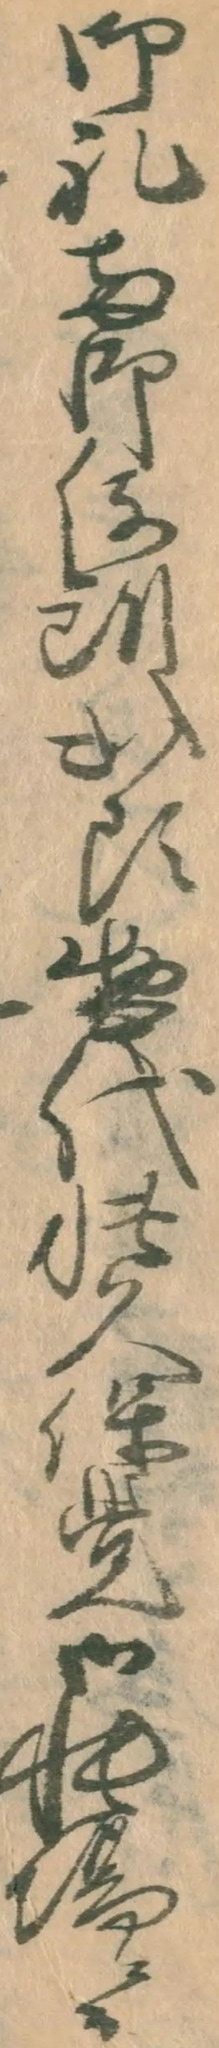御礼両御役所へ出頭惣代博久保覚御帳場ニ而
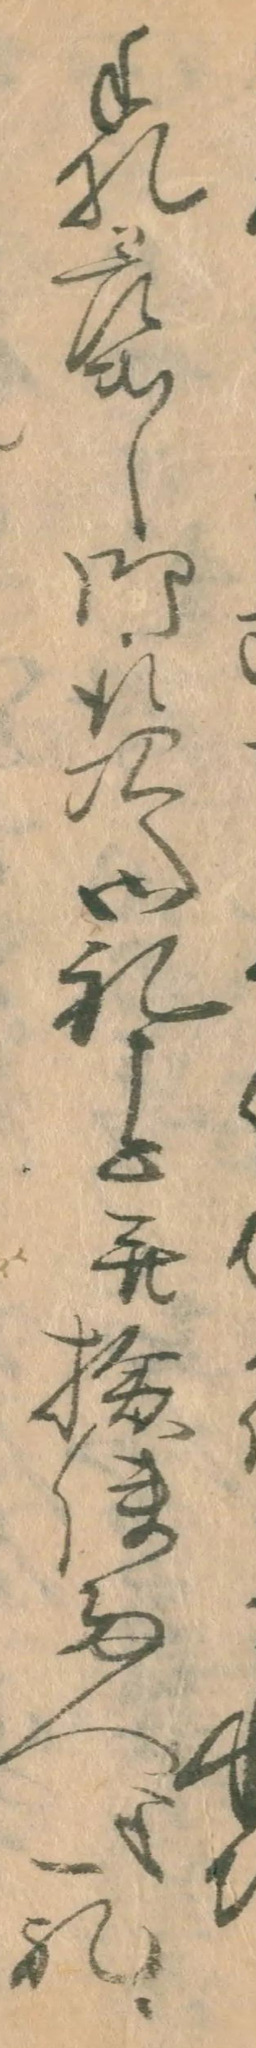手札差出し御取次へ御礼申上并検使両人へも一礼ニ
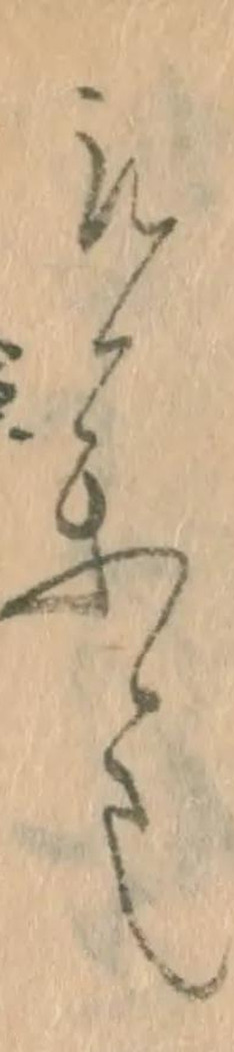被参候也
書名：賀茂社記録. 第60冊
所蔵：国立国会図書館 National Diet Library, JAPAN
